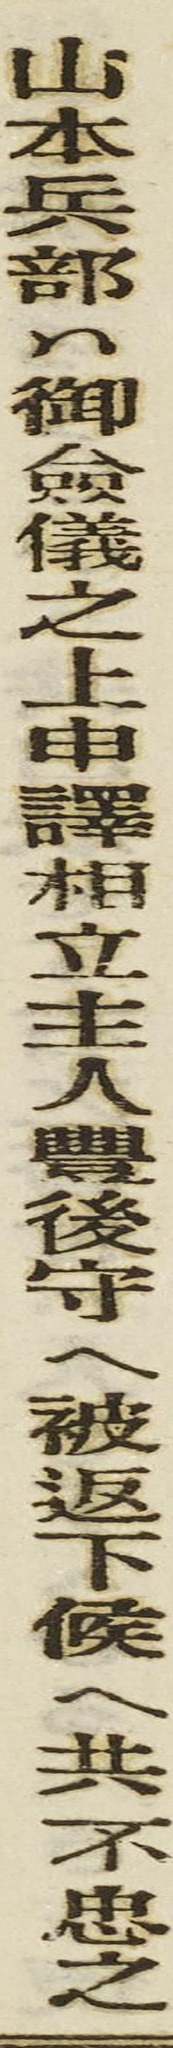山本兵部は御詮儀之上申訳相立主人豊後守へ被返下候へ共不忠之
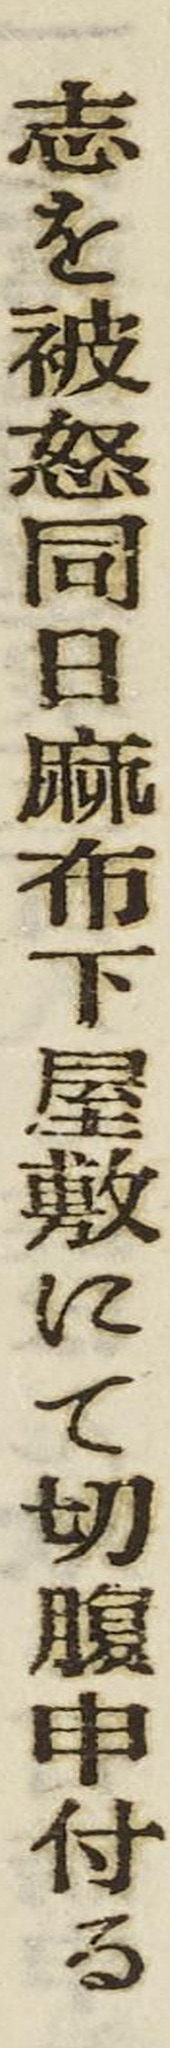志を被怒同日麻布下屋敷にて切腹申付る
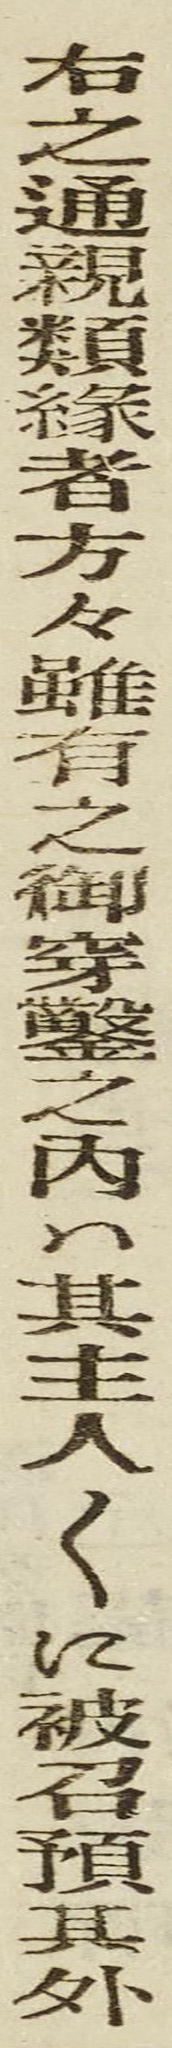右之通親類縁者方々雖有之御穿鑿之内は其主人〳〵に被召預其外
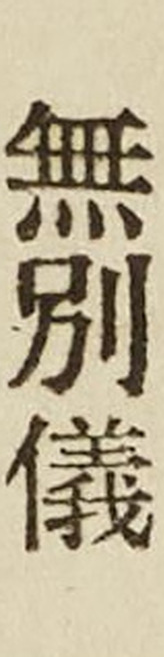無別儀
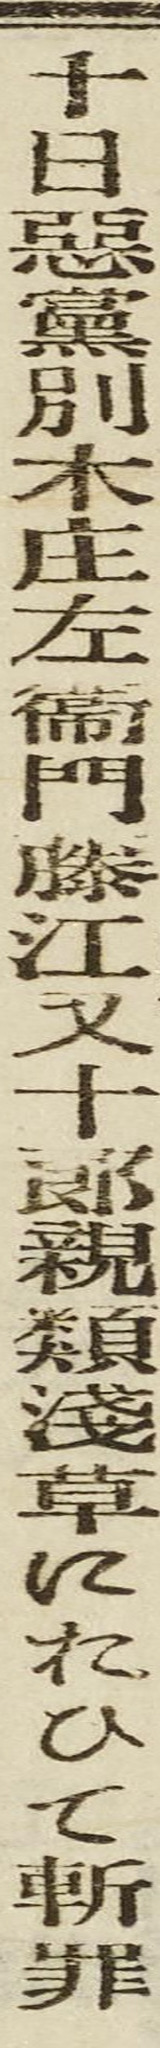十日悪党別木庄左衞門藤江又十郎親類浅草におひて斬罪
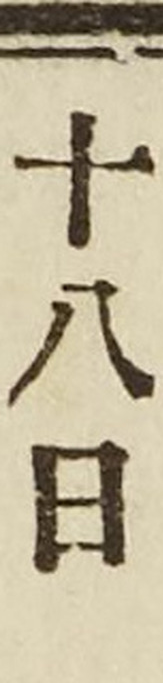十八日
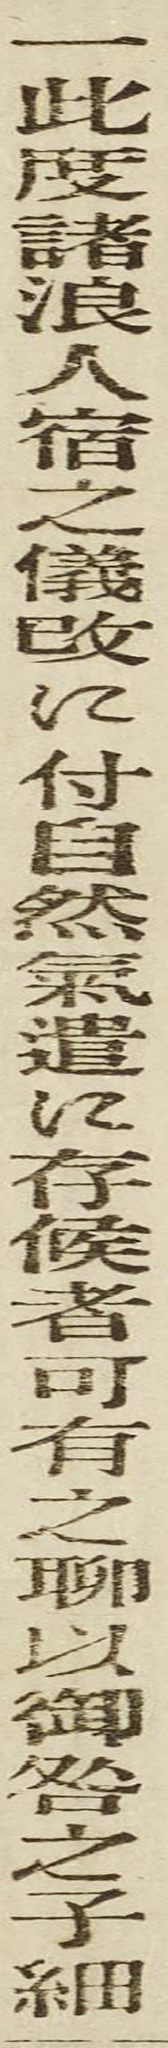一此度諸浪人宿之義改に付自然気遣に存候者可有之聊以御咎之子細
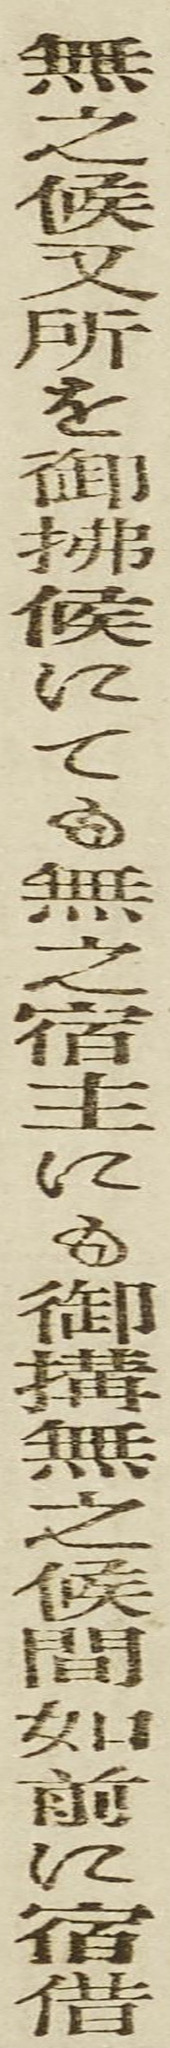無之候又所を御払候にても無之宿主にも御搆無之候間如前に宿借
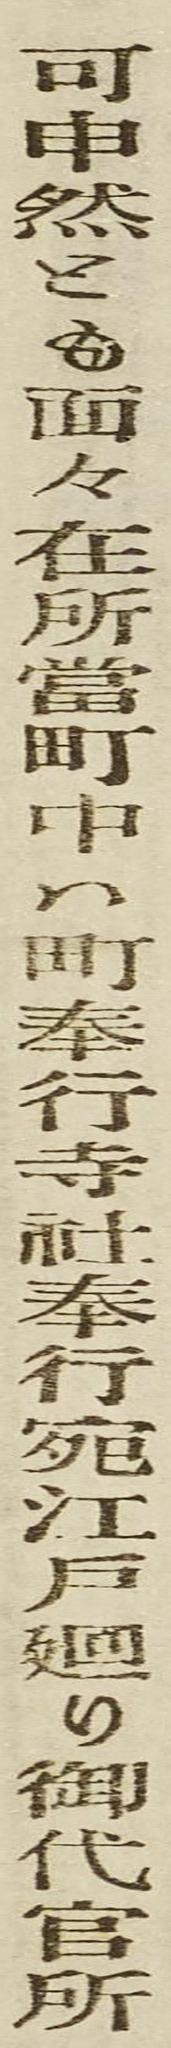可申然とも面々在所当町中は町奉行寺社奉行宛江戸廻り御代官所
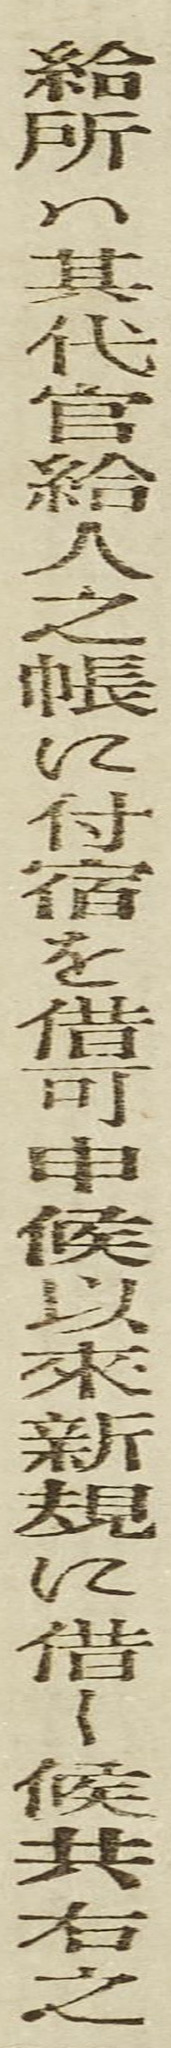給所は其代官給人之帳に付宿を借可申候以来新規に借し候共右之

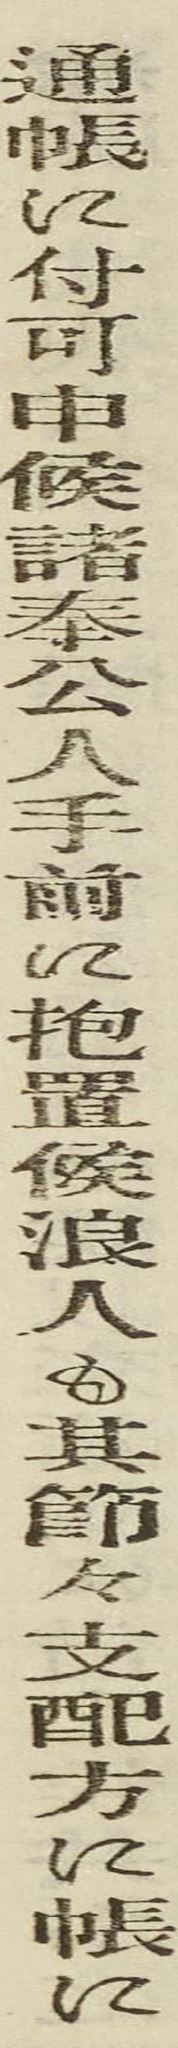通帳に付可申候諸奉公人手前に抱置候浪人も其節々支配方に帳に
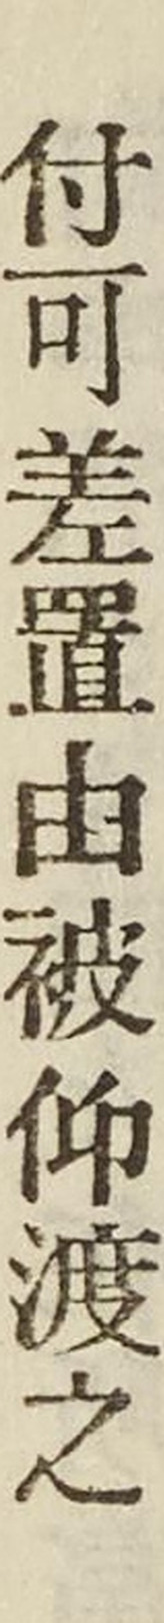付可差置由被仰渡之
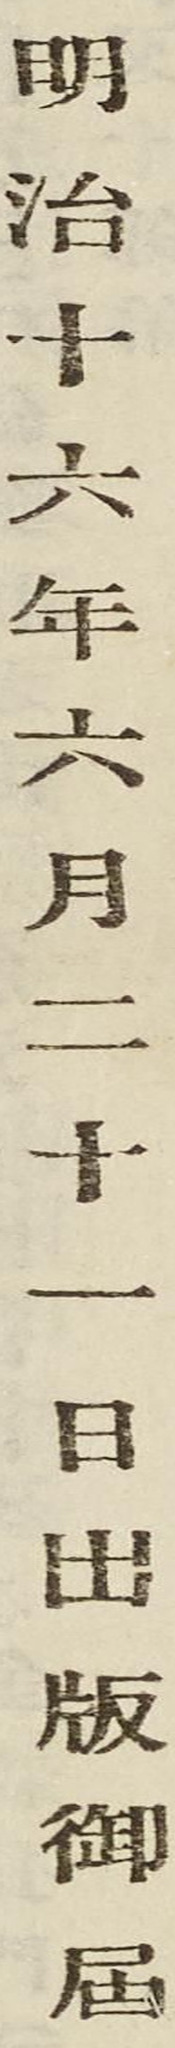明治十六年六月二十一日出版御届
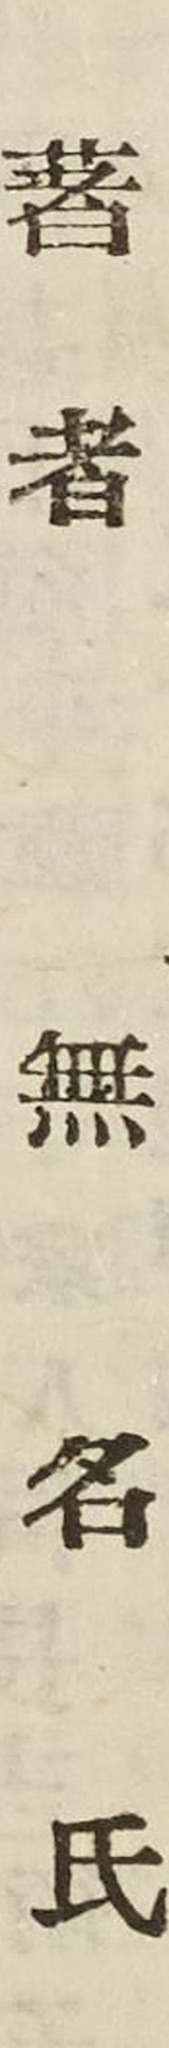著者無名氏
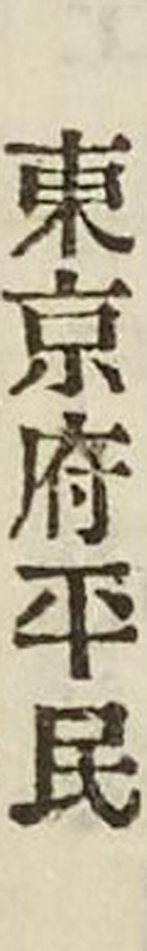東京府平民
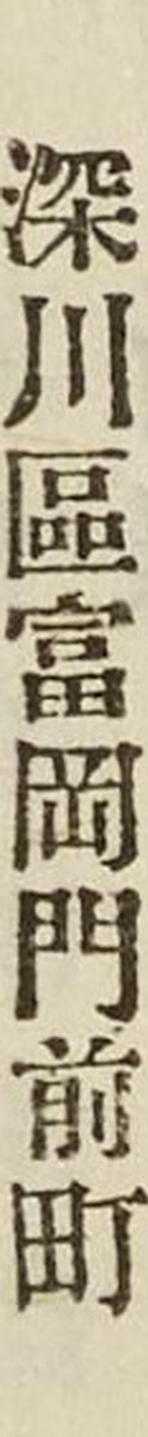深川区富岡門前町
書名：史籍集覽　朝鮮陣古文・細井廣澤記・颶風紀事・天明七年將軍宣下次第書　全
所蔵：東京大学地震研究所図書室 Earthquake Research Institute Library, The University of Tokyo, JAPAN
